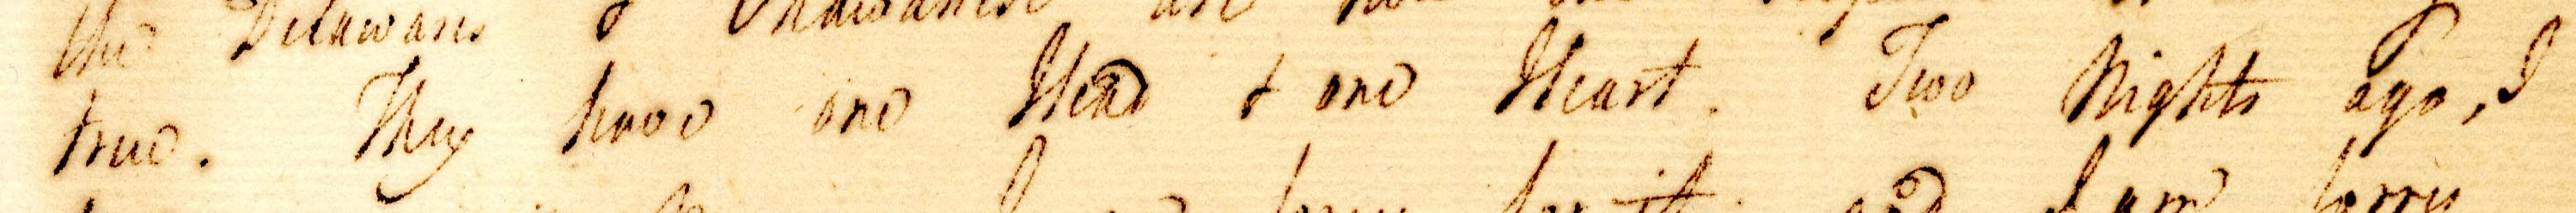true. They have one Head & one Heart. Two Nights ago, I
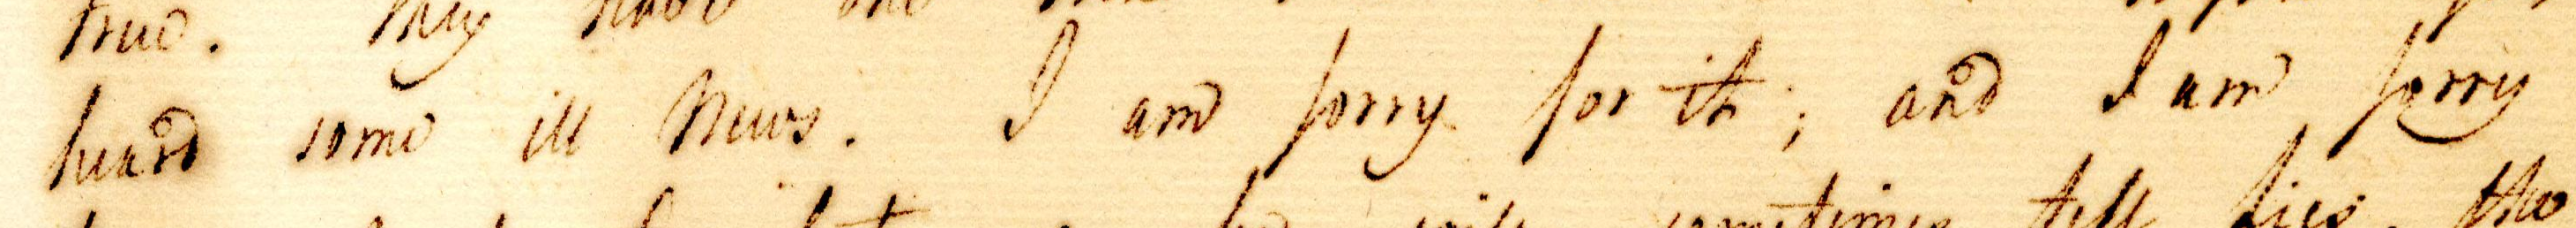heard some ill News. I am sorry for it; and I am sorry
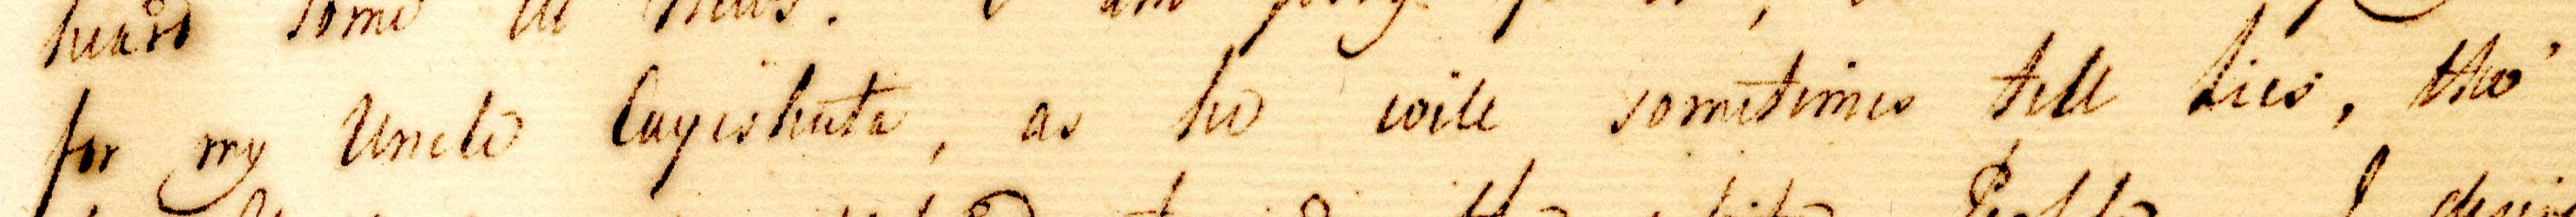for my Uncle Cuyishuta, as he will sometimes tell Lies, tho'
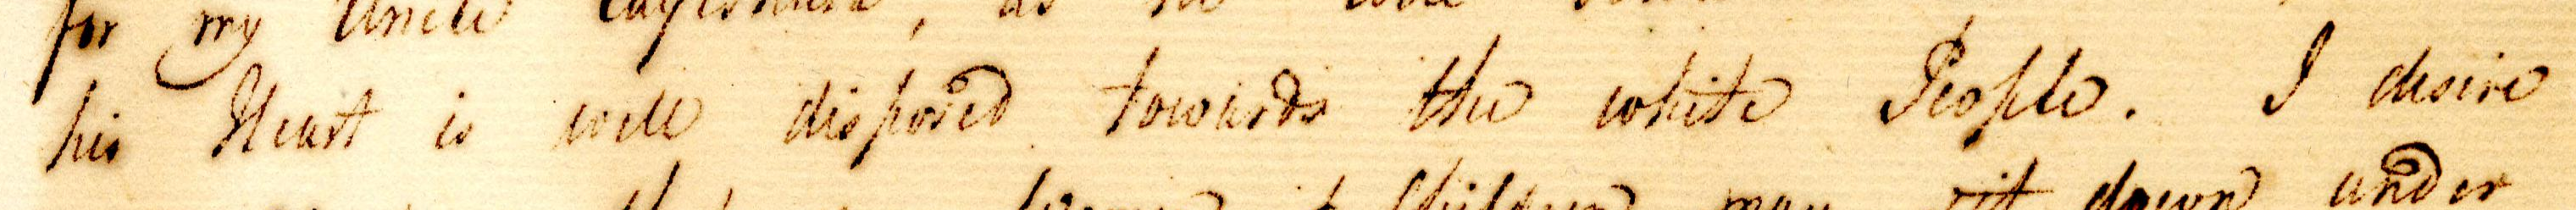his Heart is well disposed towards the white People. I desire
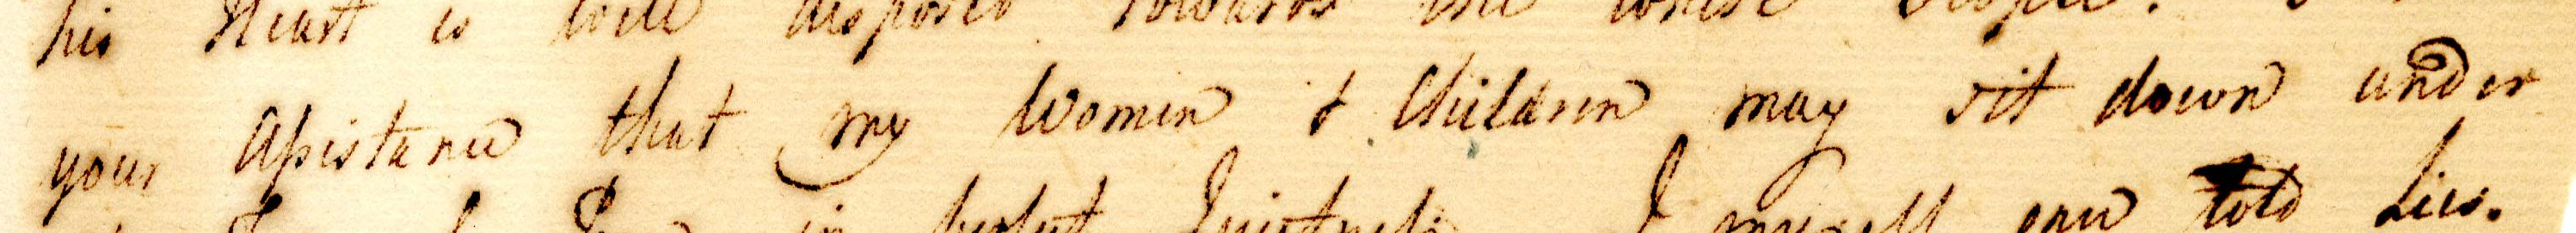your Assistance that my women & Children may sit down under
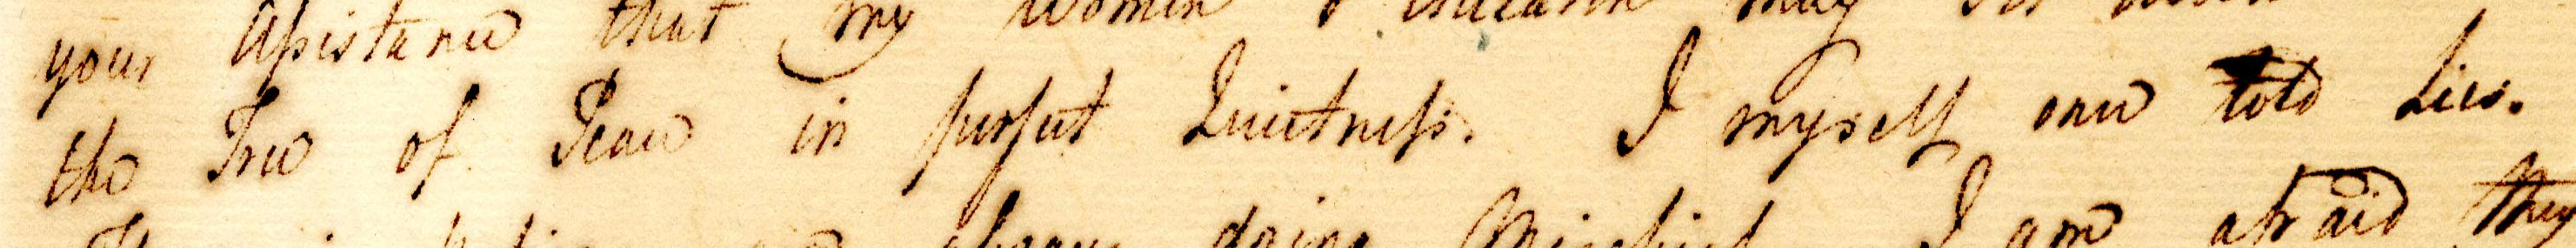the Tree of Peace in perfect Quietness. I myself once told Lies.
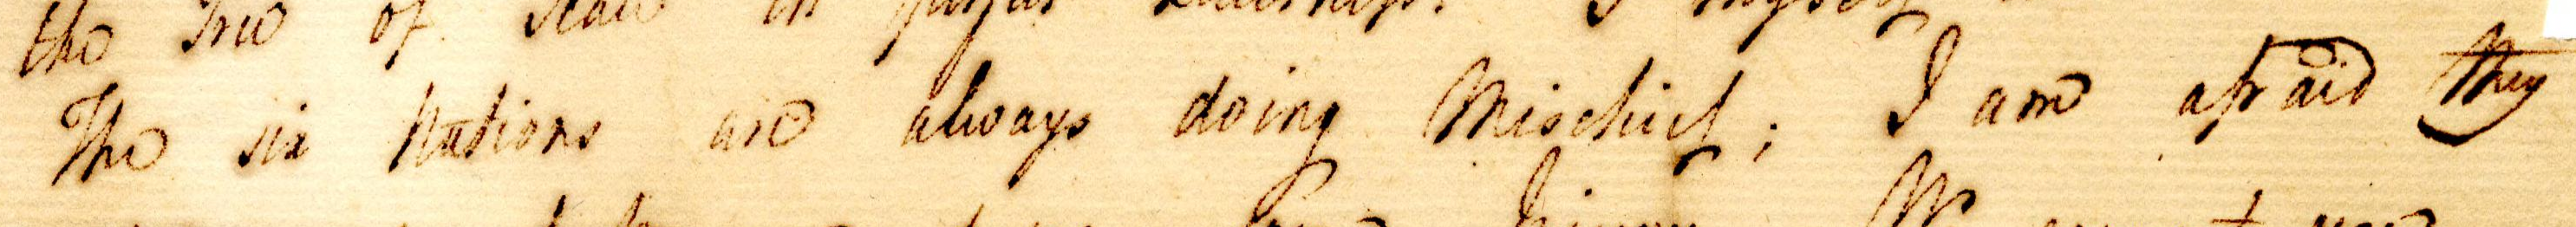The six Nations are always doing Mischief; I am afraid they
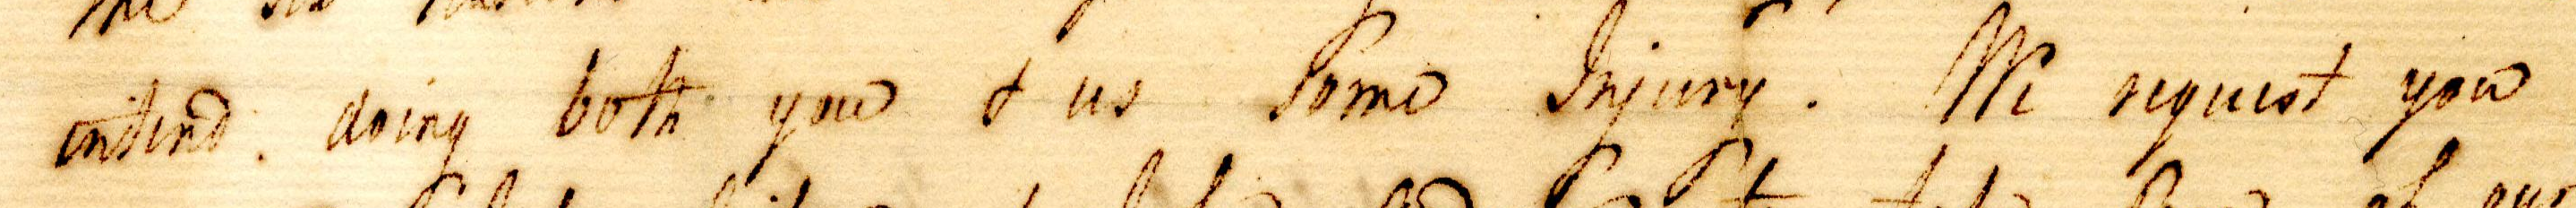intend, doing both you & us some Injury. We request you
